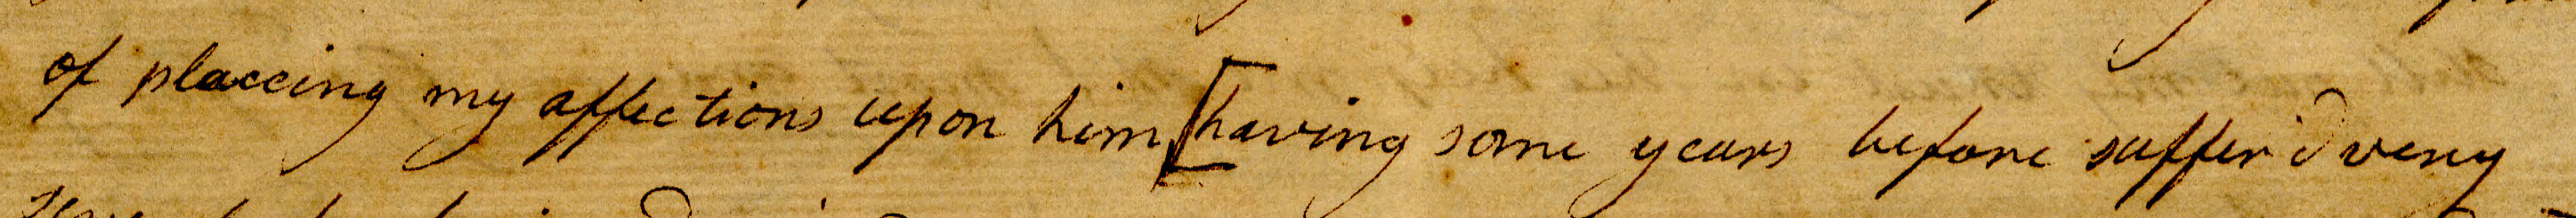of placeing my affections upon him (having some years before suffer'd very
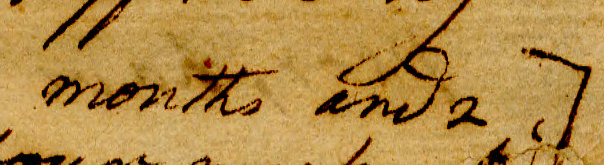months and 2)
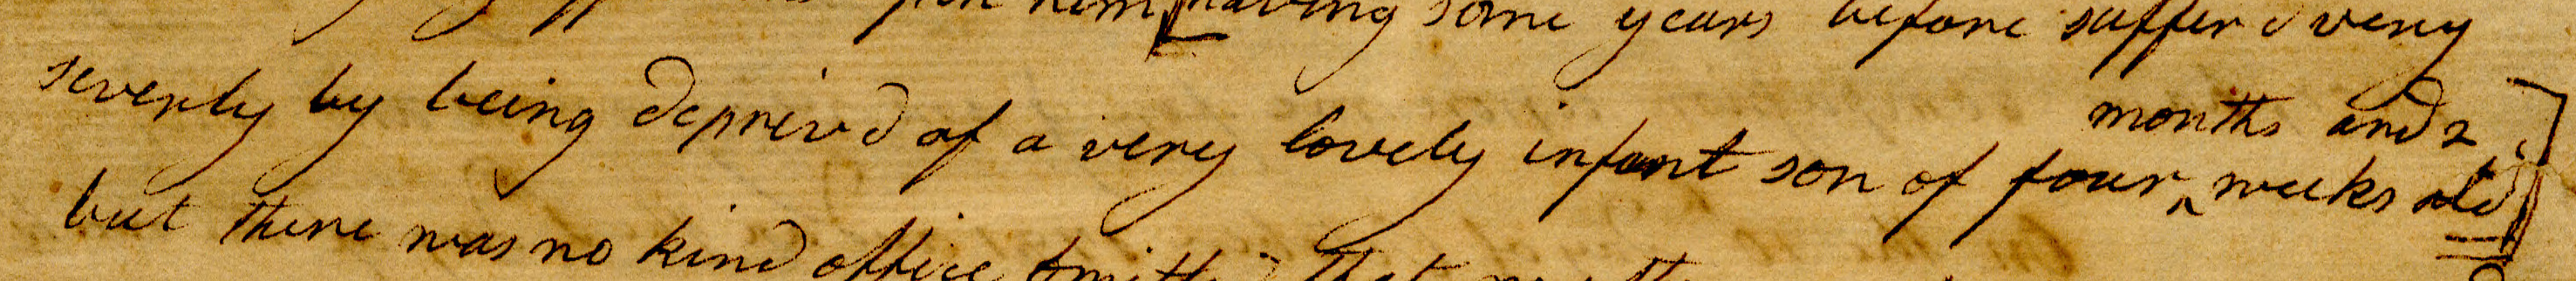severly by being deprivd of a very lovely infant son of four ^ weeks old)
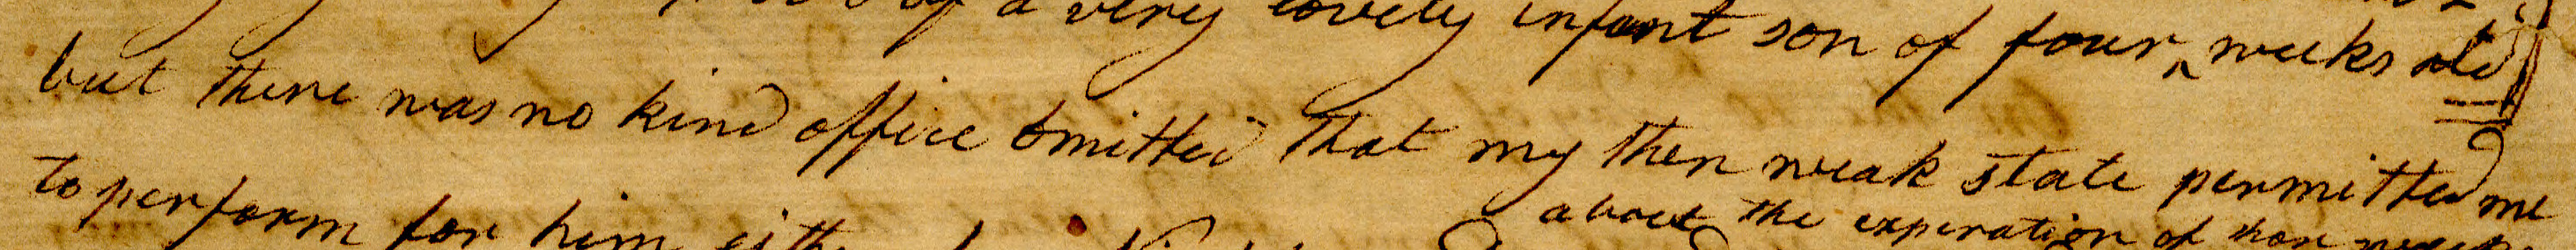but there was no kind office omitted that my then weak state permitted me
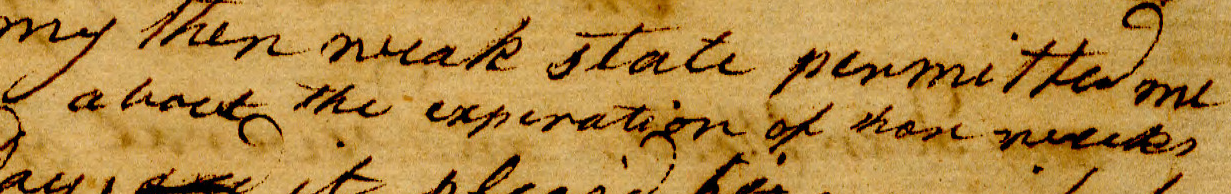about the experation of those weeks
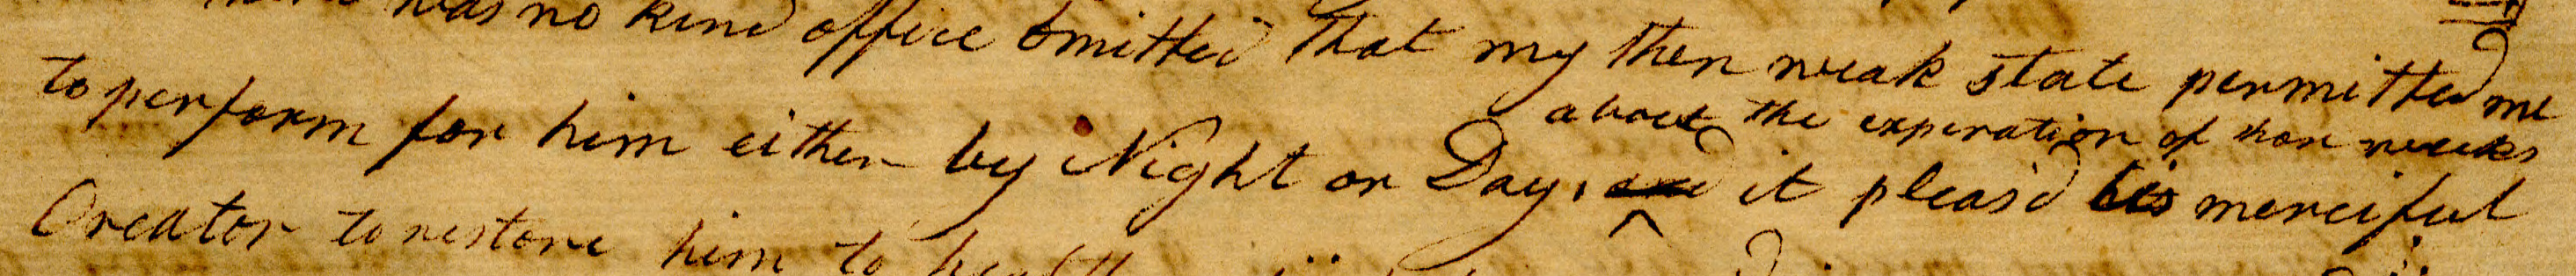to perform for him either by Night or Day, [as] ^ it pleas'd his merciful
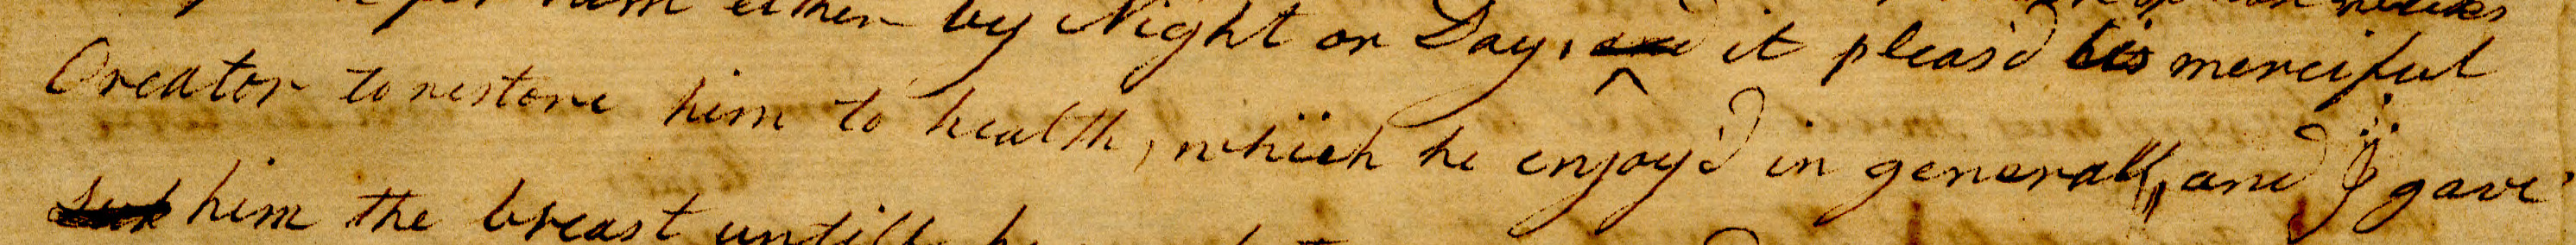Creator to restore him to health, which he enjoy'd in generall, and I gave
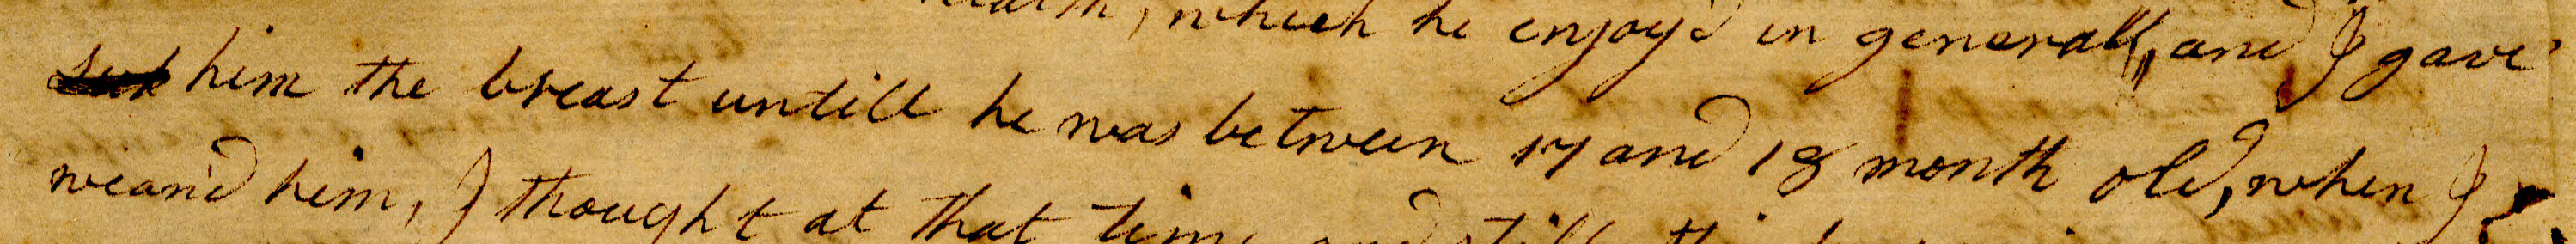[suk] him the breast until he was between 17 and 18 month old, when I
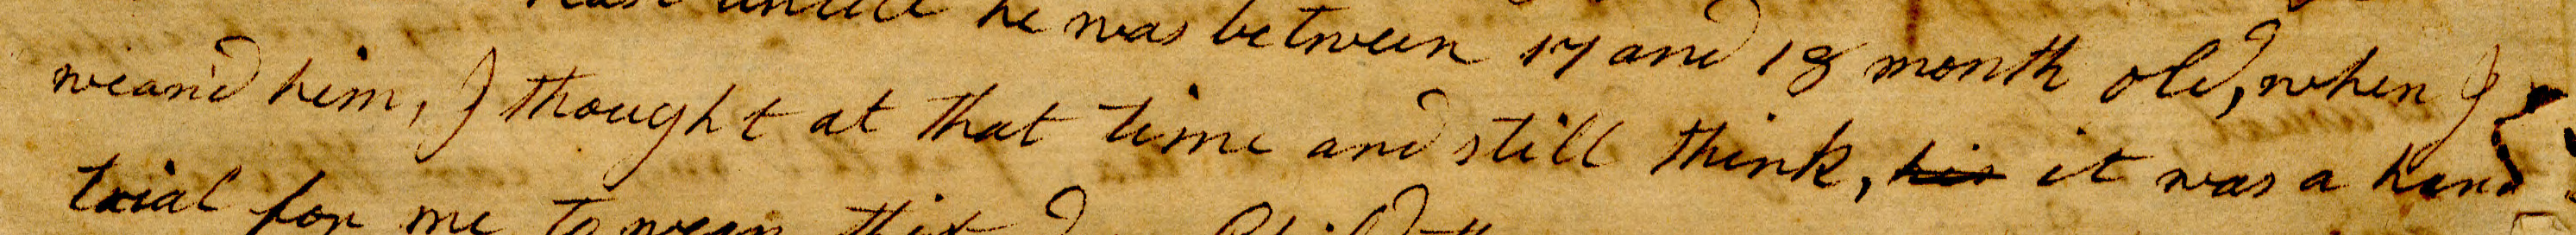wean'd him, I thought at that time and still think, [his] it was a hard
